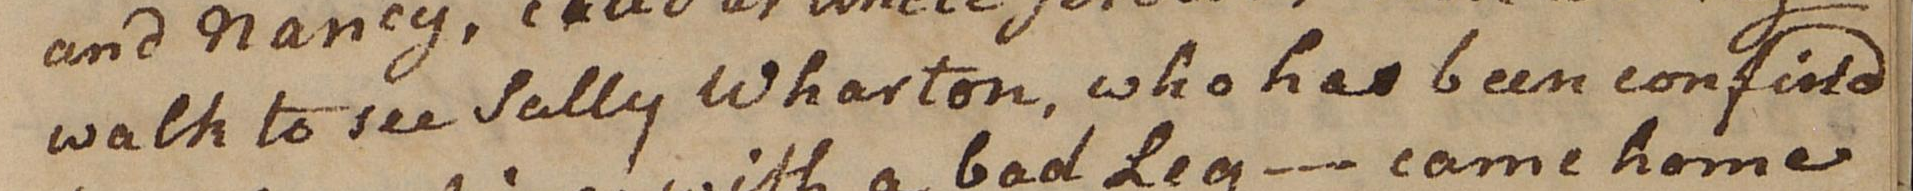walk to see Sally Wharton, who has been confin'd
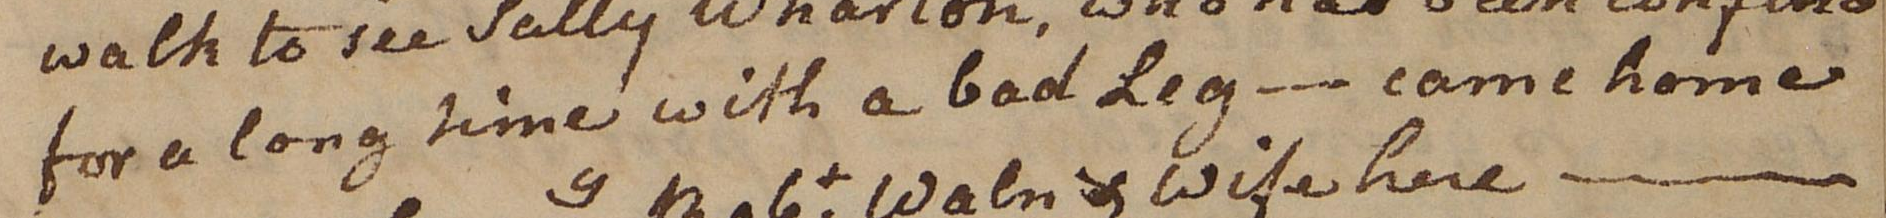for a long time with a bad Leg- came home
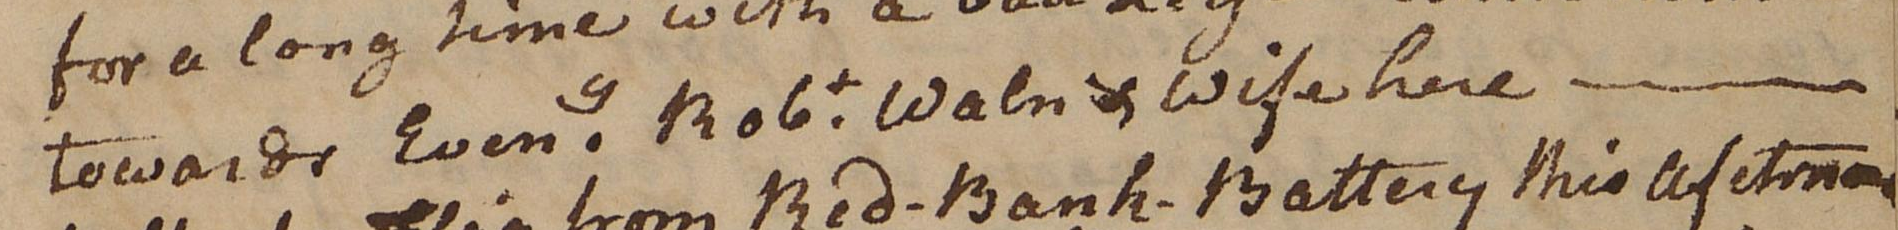towards Even'g. Rob^t. Waln & wife here-
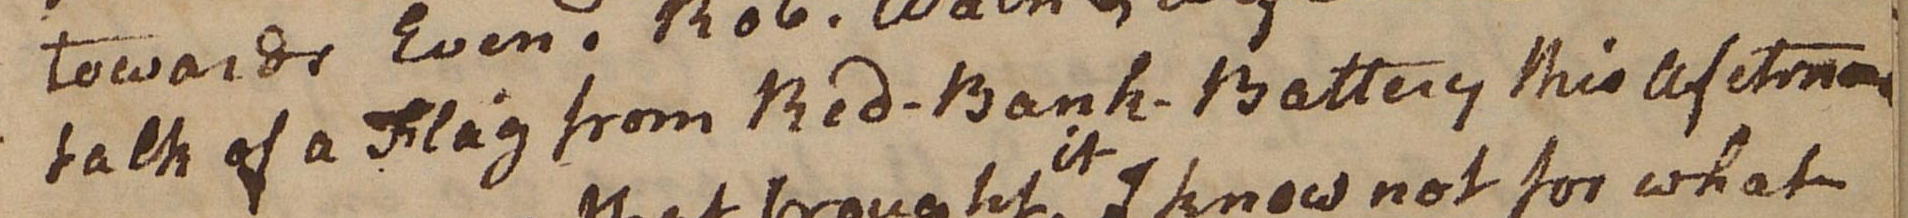talk of a Flag from Red- Bank- Battery this Afetrnoo[n]
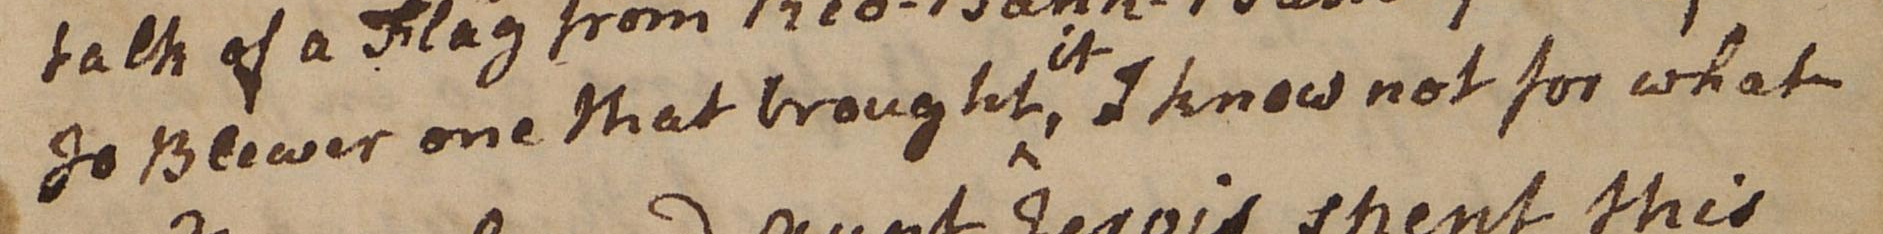Jo Blewer one that brought ^it , I know not for what
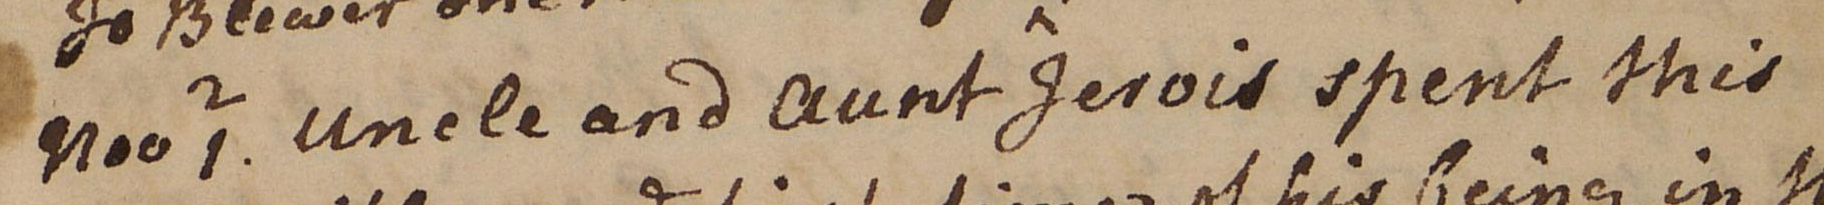Nov^2. Uncle and Aunt Jervis spent this
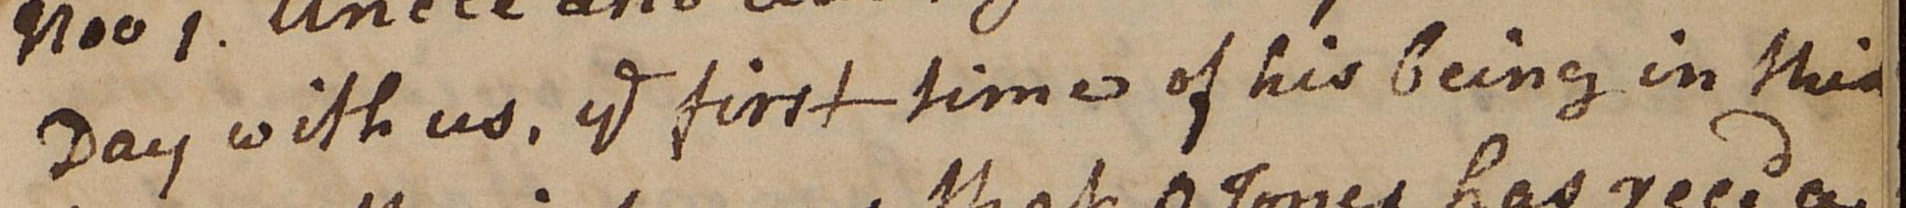Day with us, y^e first time of his being in this
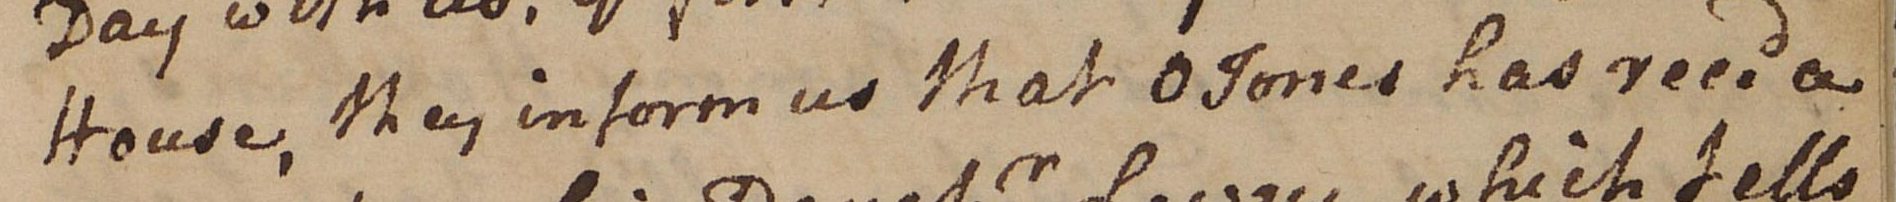House they inform us that 0 Jones has rec^d. a
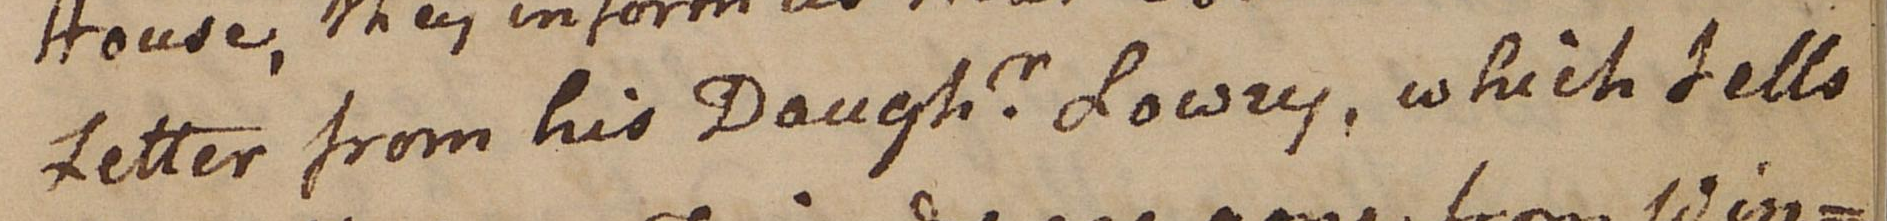Letter from his Daugh^r. Lowry, which tells
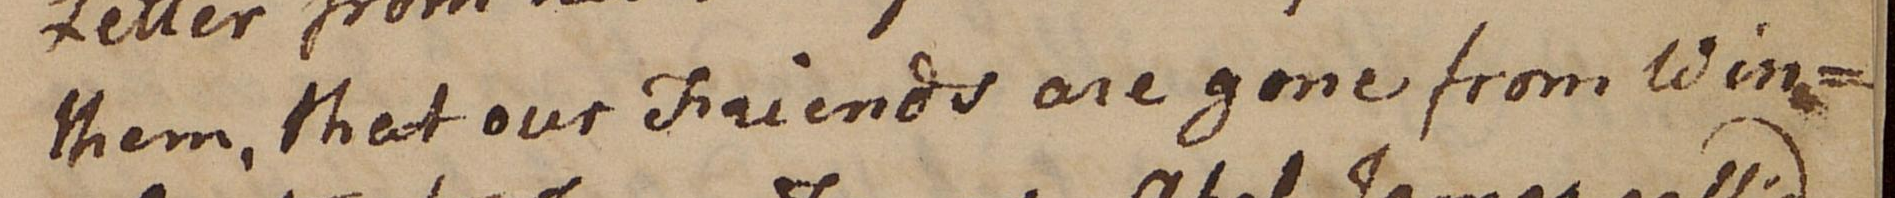them, that our Friends are gone from Win-
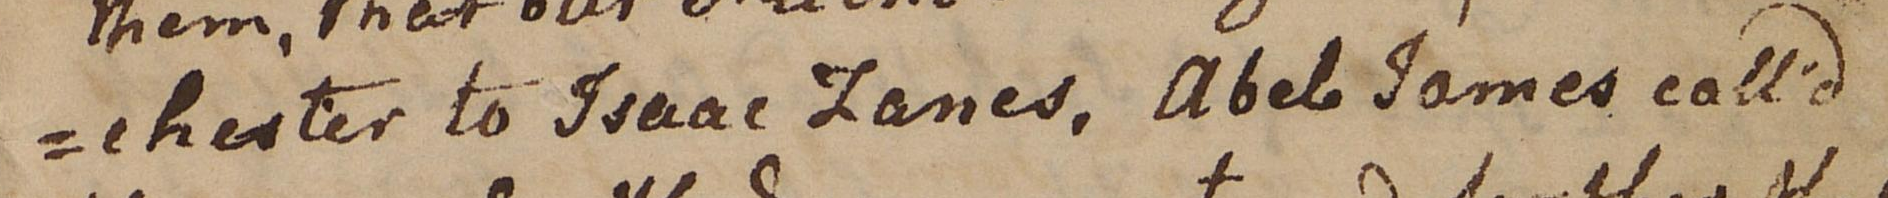-chester to Isaac Zanes, Abel James call'd
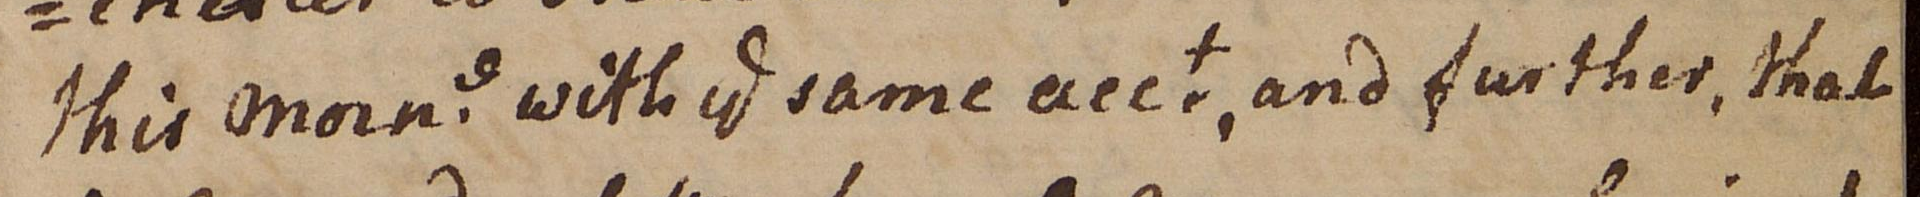this morn^g. with y^e same acc^t., and further, that
